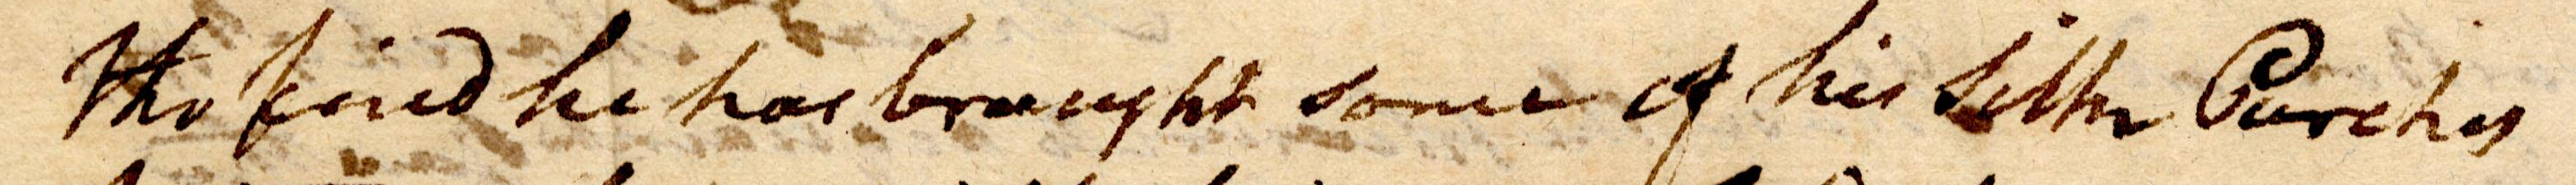the find he has brought since of his silk Purches
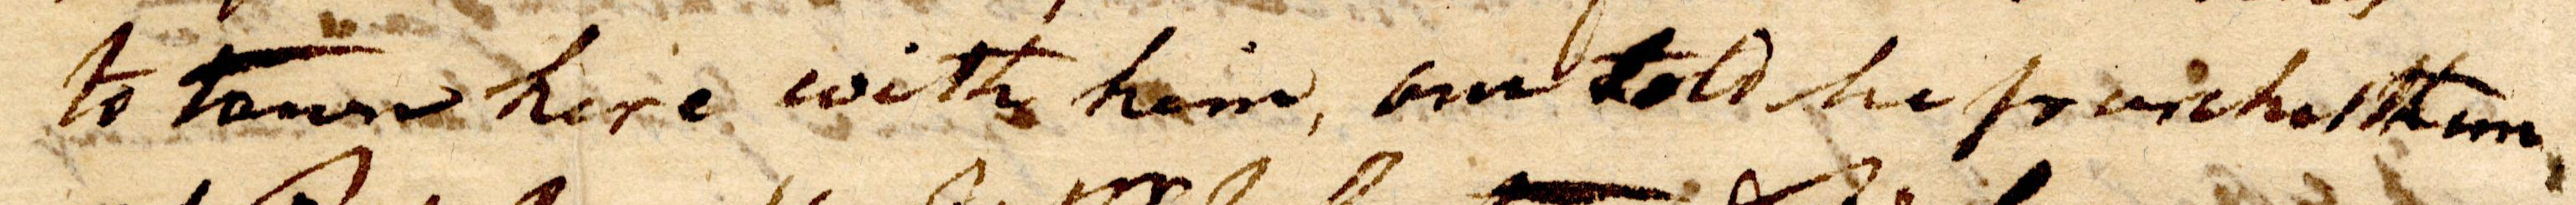to town here with him, are told he purchas them
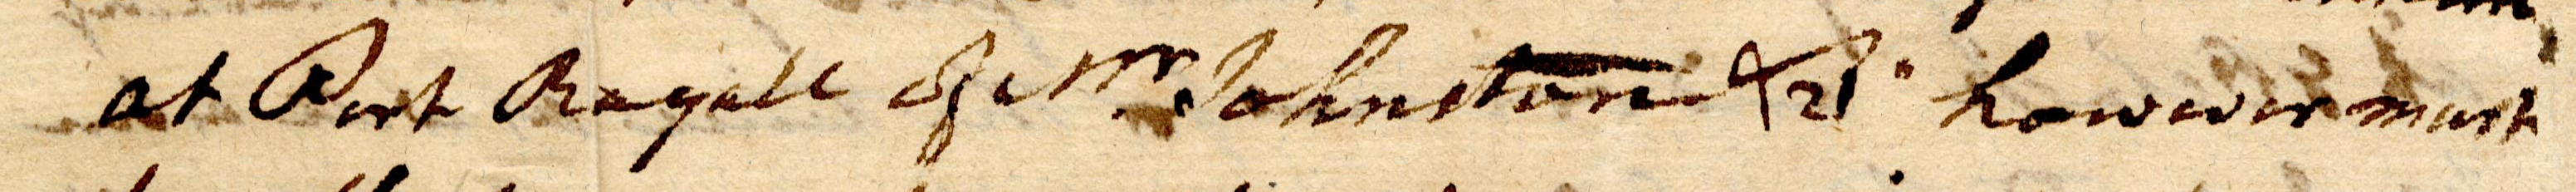at Port Royall of M^r. Johnston &c however must
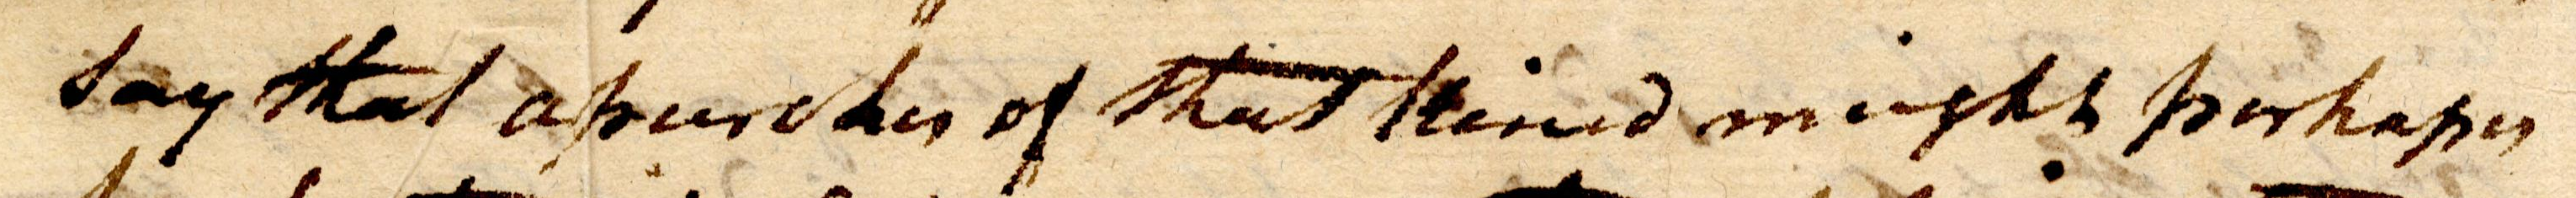say that a purches of that kind might perhaps
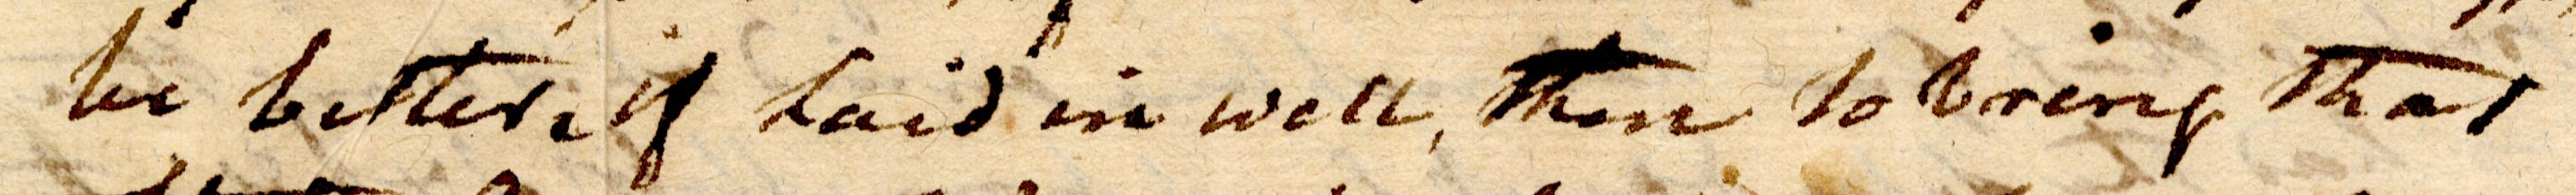be better if Laid in well, there to bring that
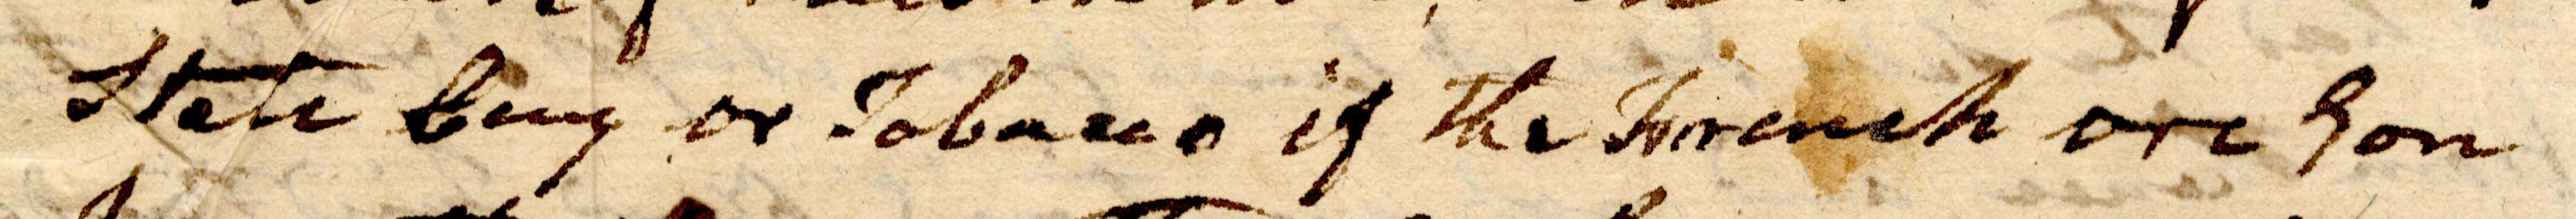State buy or Tobacco if the French are gon
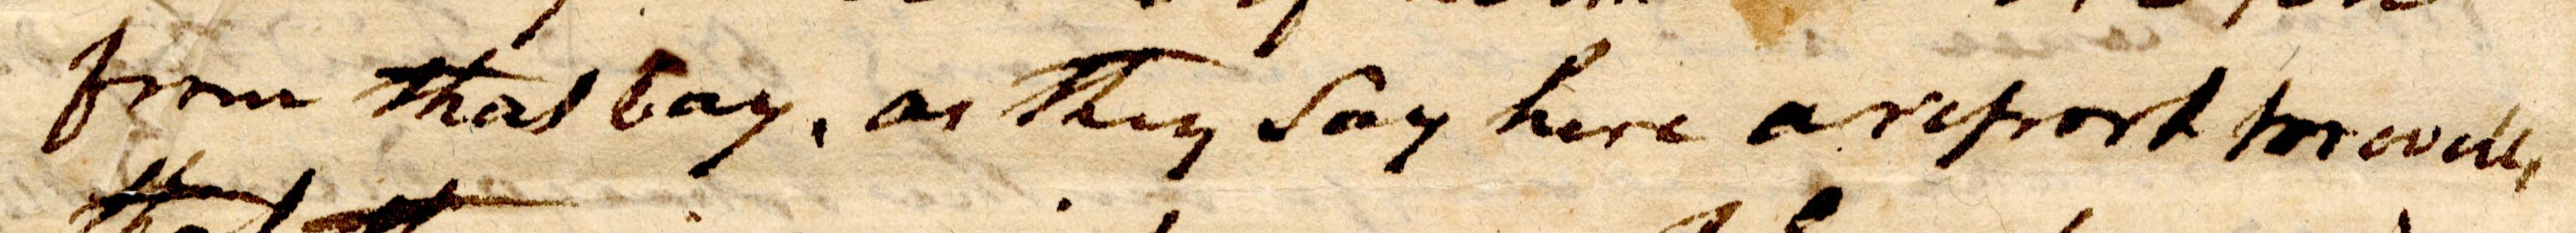from that bay, as they say here a report for well
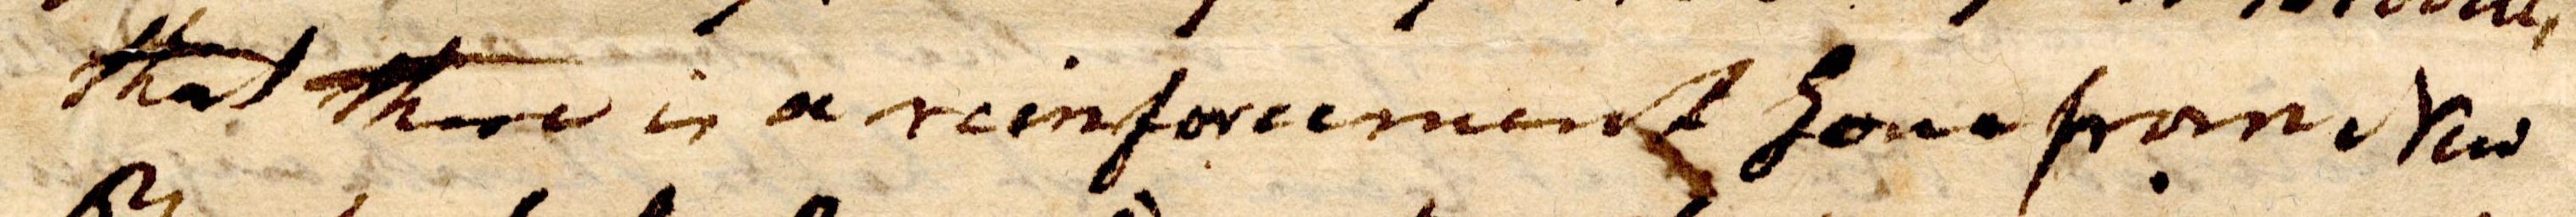that there is a reinforcement Gone from New
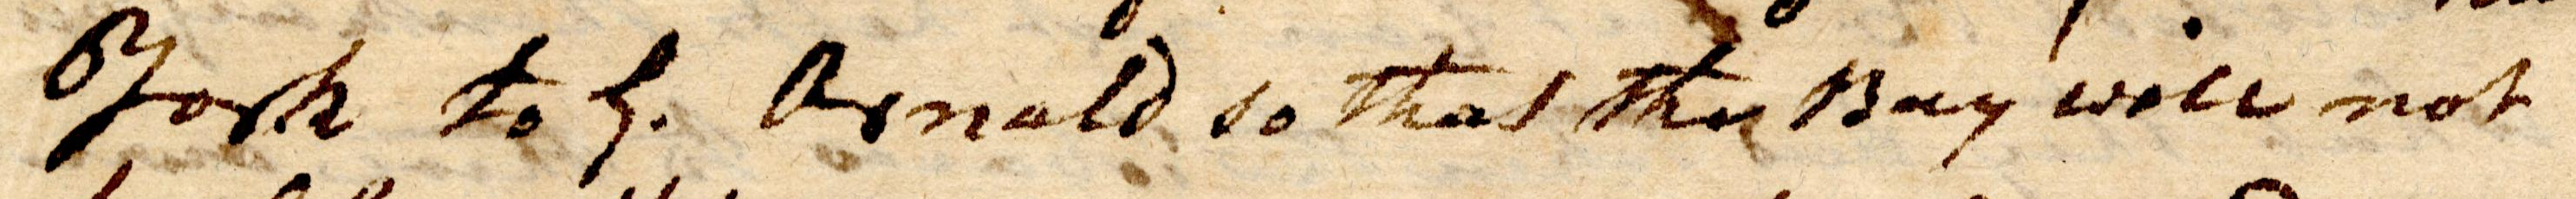York to G. Arnold so that the Bay will not
